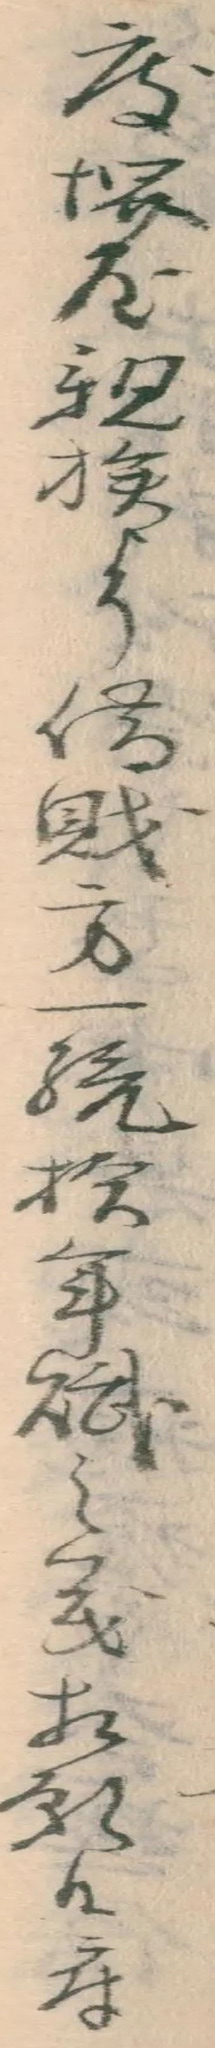度堺屋親族より借財方一統拾年賦之義相願候ニ付
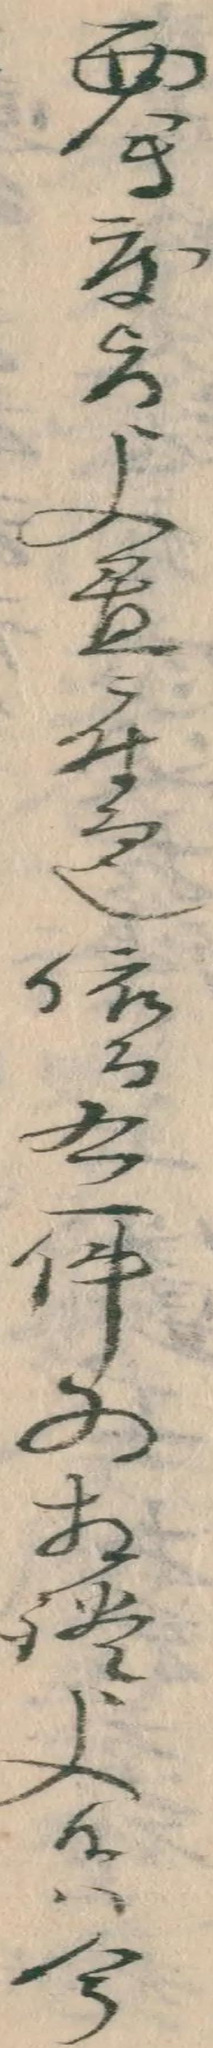面會度旨申入置に付而也依而右一件為相談申入候ハ今
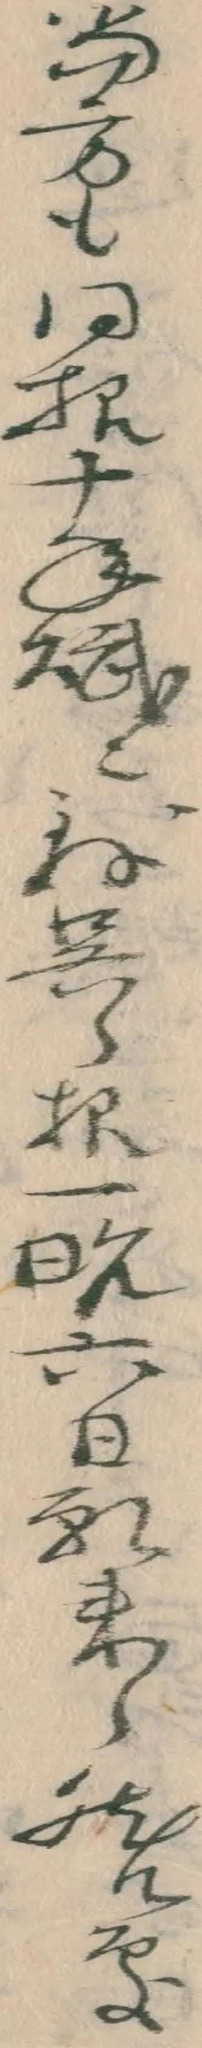當方も同様十年賦に致呉候様一昨六日願来候然ル處
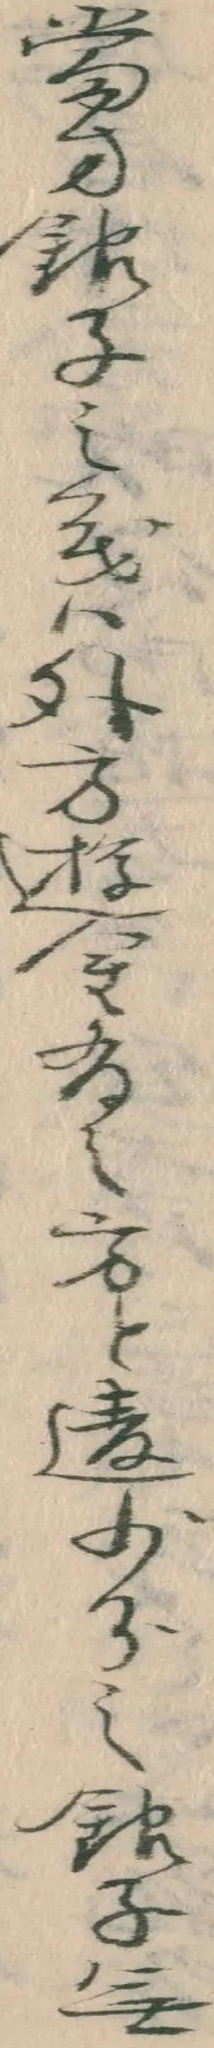當方銀子之義ハ外方遊金有之方と違少分之銀子無
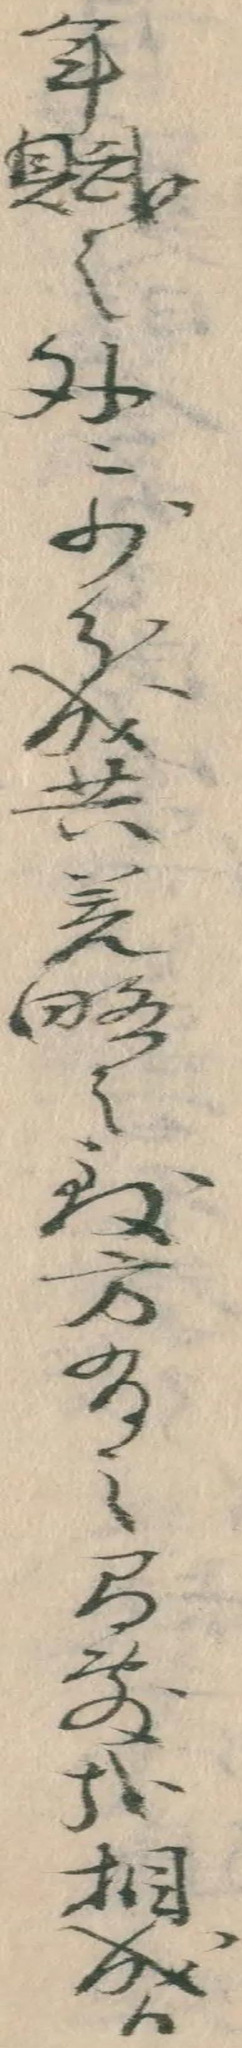年賦之外ニ少分成共覚略之致方有之間敷哉相成候
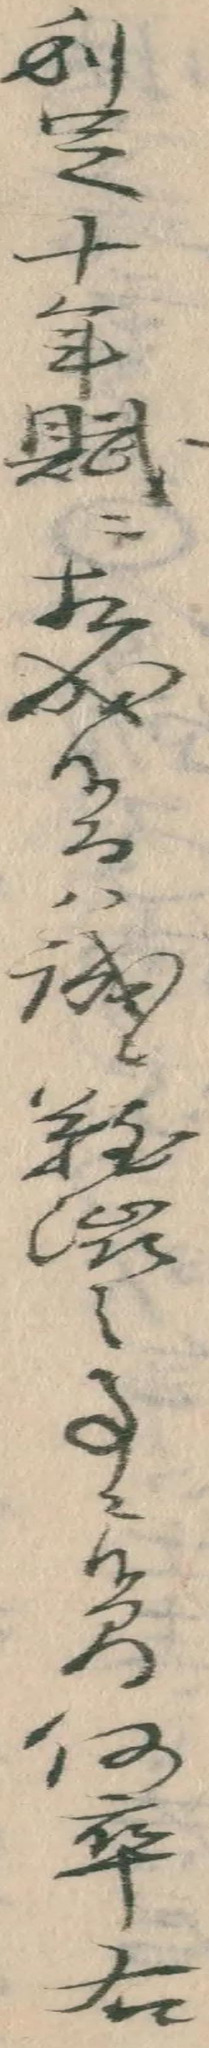利足十年賦ニ相成候而ハ誠ニ難渋之事ニ候間何卒右
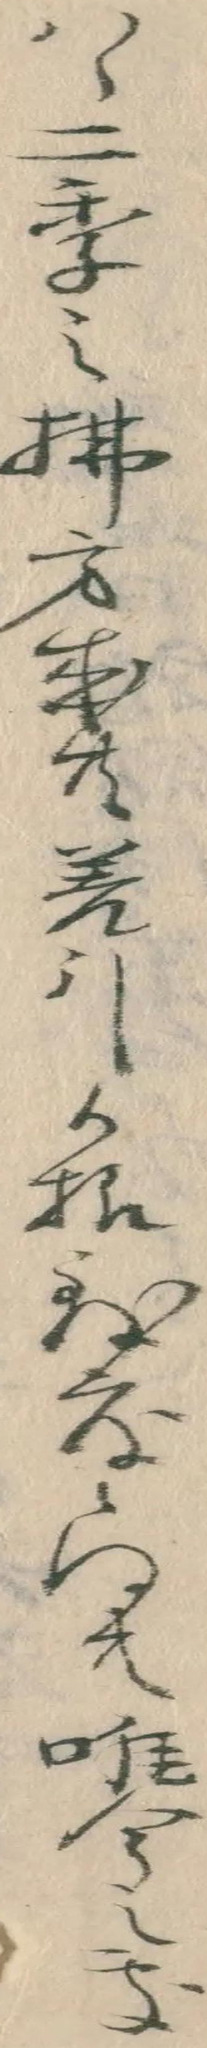ハヽ二季之拂方或共差引候様致度候得共唯今之處
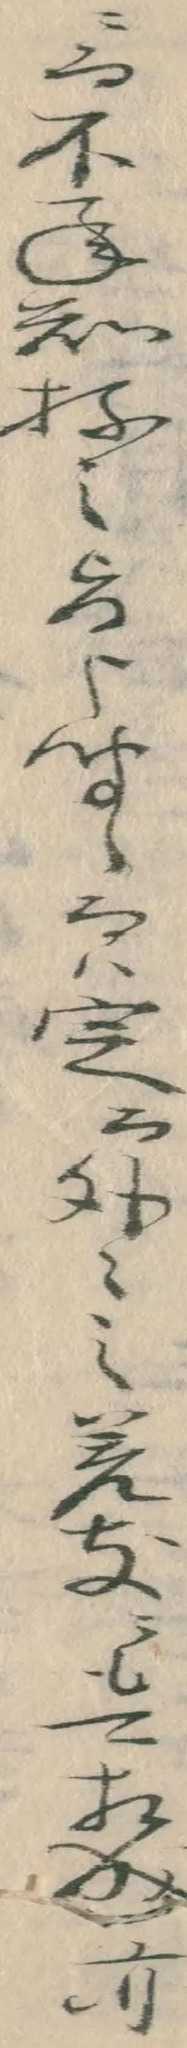ニ而不承知様之旨申聞候而ハ定而外々之差支ニも可相成亦
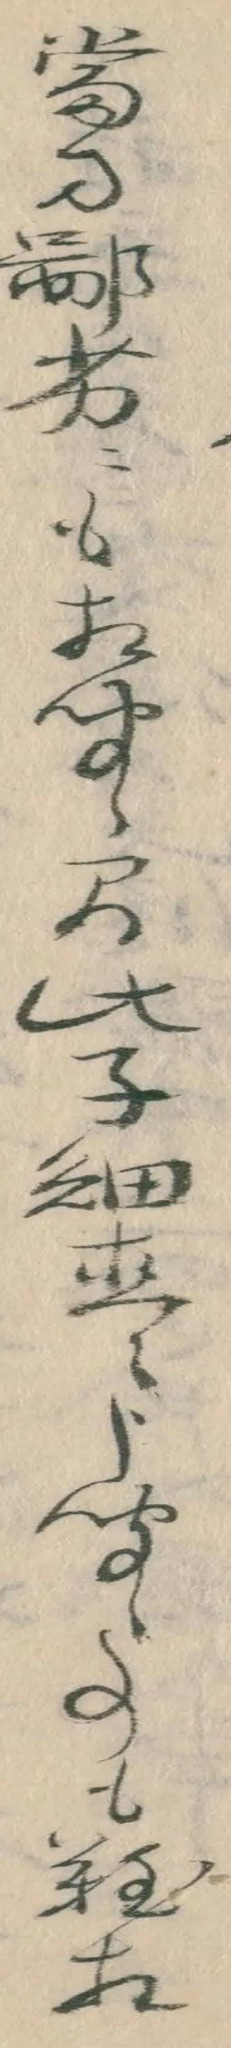當方鄙劣ニも相聞候間此子細直々申聞候事も難相
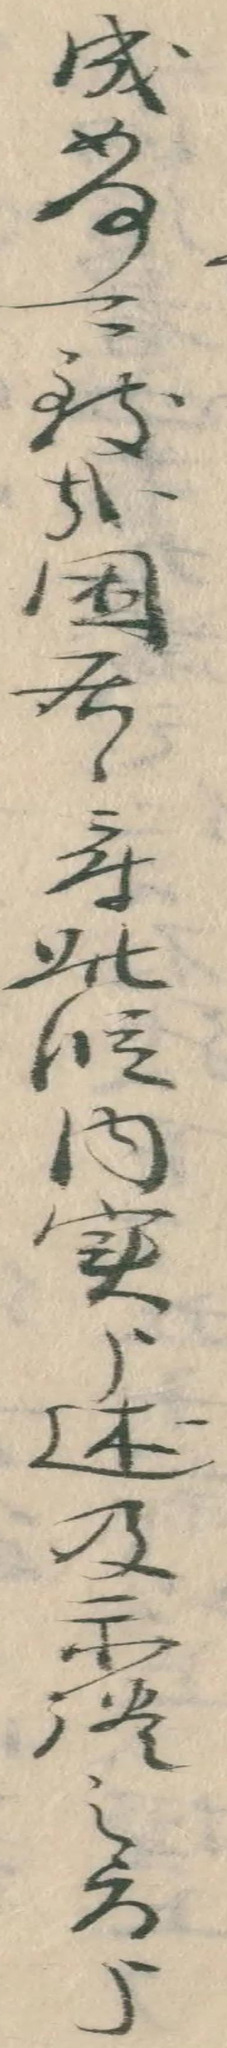成如何可致哉困居候にニ付此段内実申述及示談之旨申
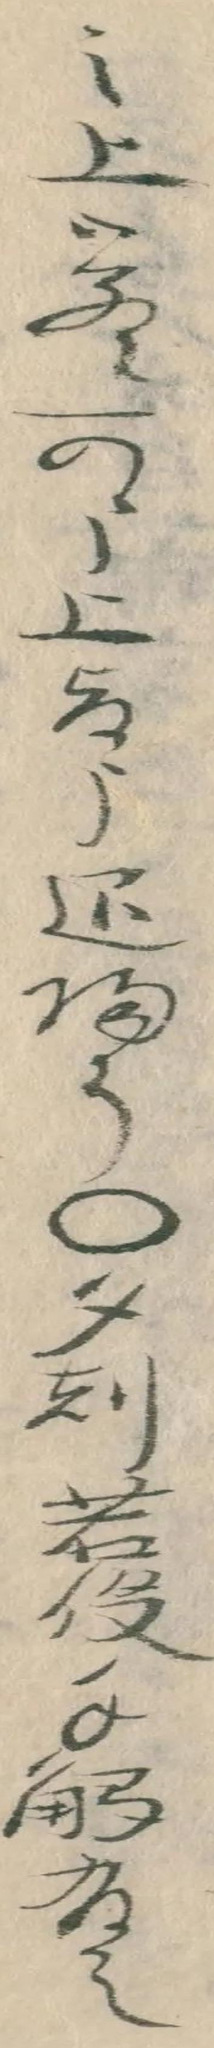之上御答可申上旨申退帰了○夕刻若役手触有之
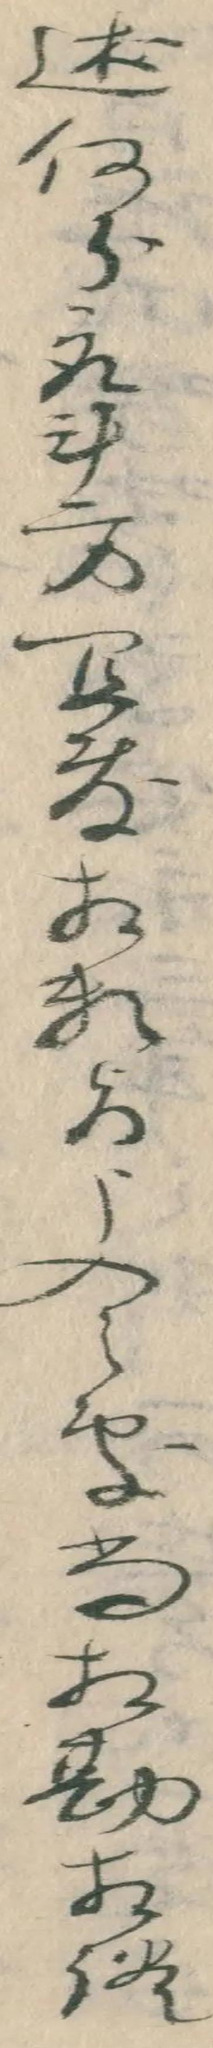述何分取計方宜敷相頼旨申入候處尚相勘相談
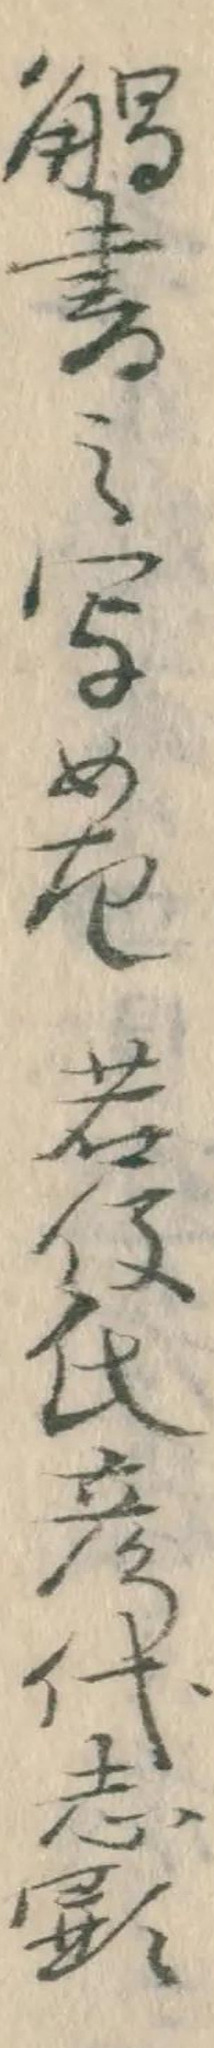触書之写如左若役氏彦代志顕
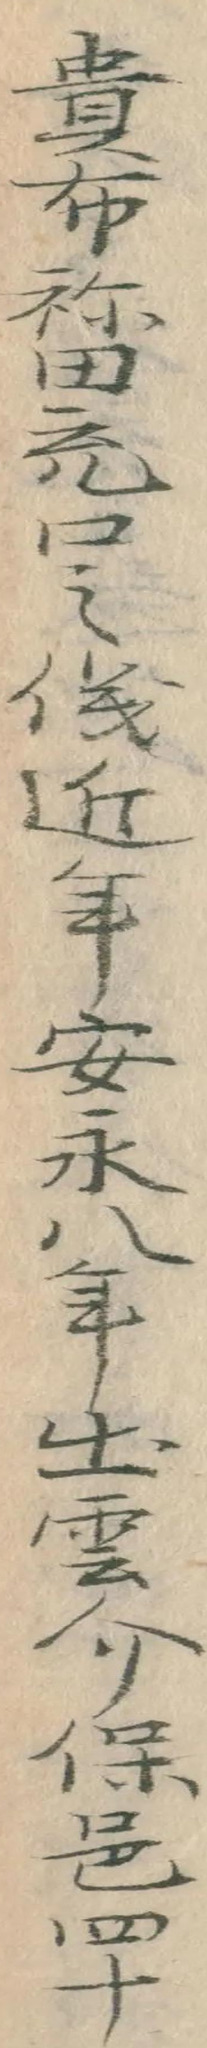貴布祢田充口之儀近年安永八年出雲介保邑四十

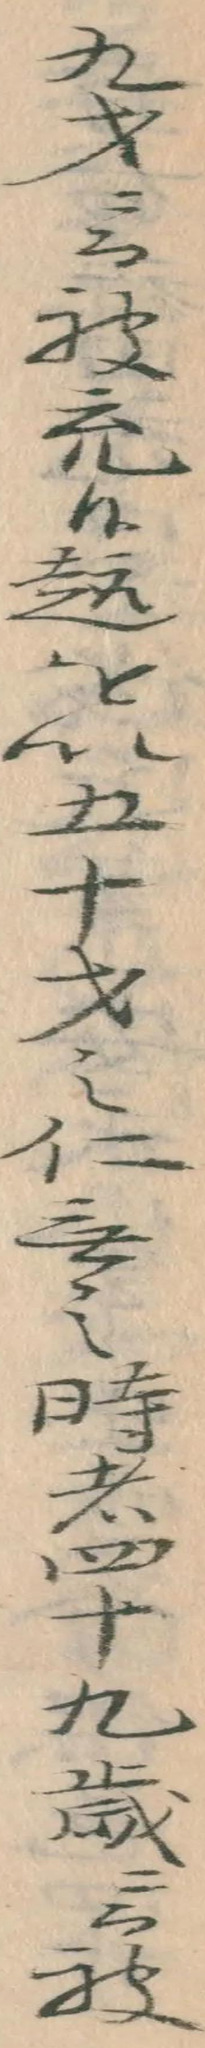九才ニ而被充候趣を以五十才之仁無之時者四十九歳ニ而被
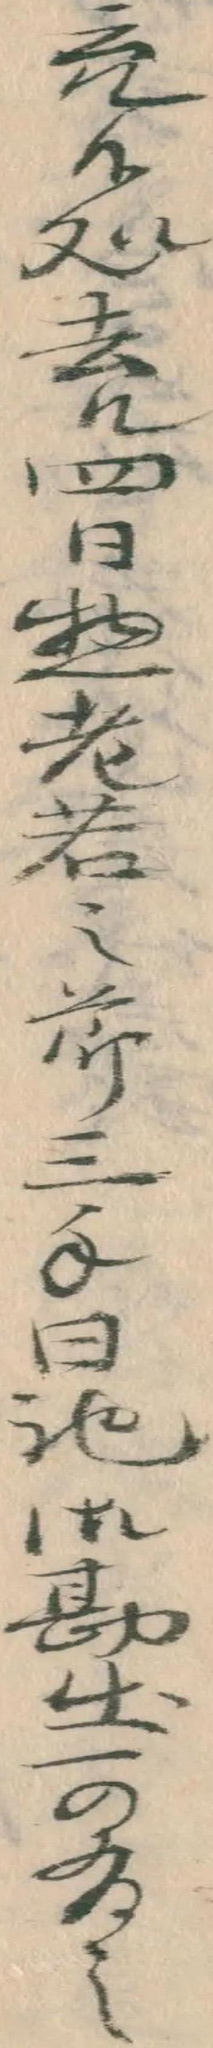充候処去ル四日惣老若之節三手日記御勘出可有之
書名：賀茂社記録. 第63冊
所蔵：国立国会図書館 National Diet Library, JAPAN
